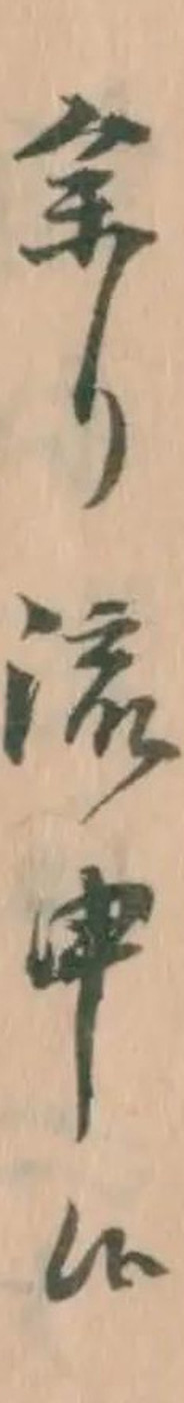余り流申候
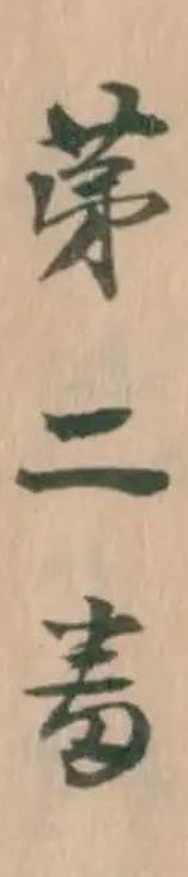第二番
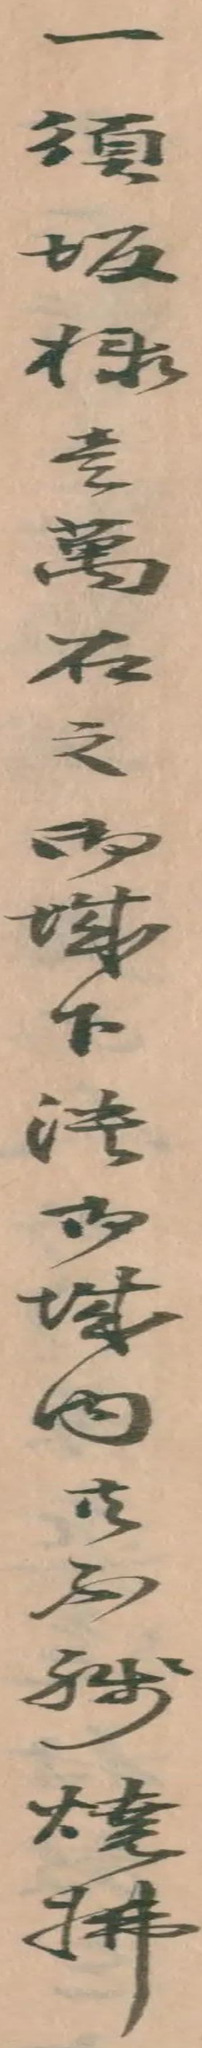一須坂様壱万石之御城下潰御城内共不残焼払
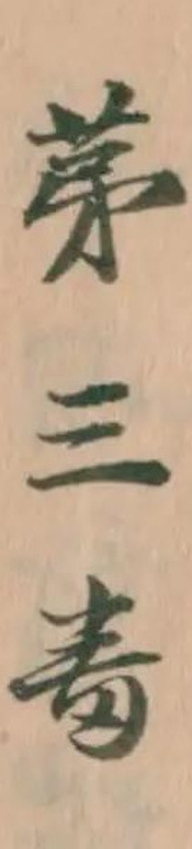第三番
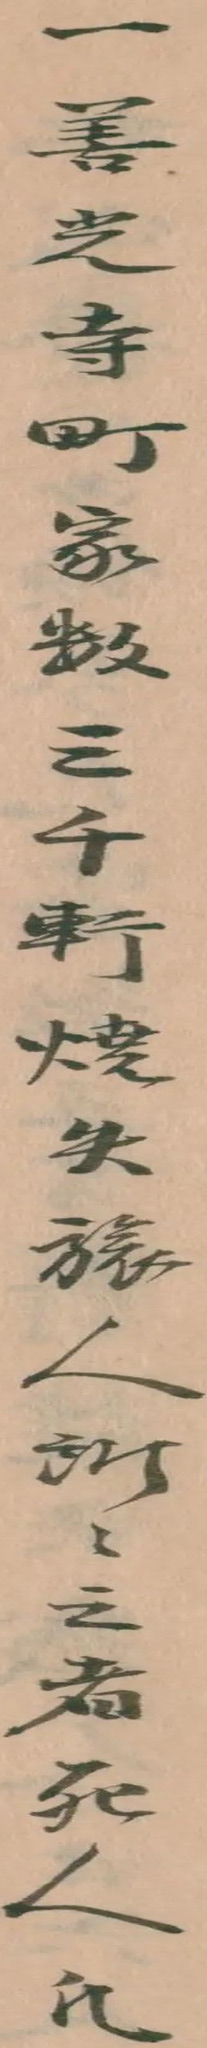一善光寺町家数三千軒焼失旅人所々之者死人凡
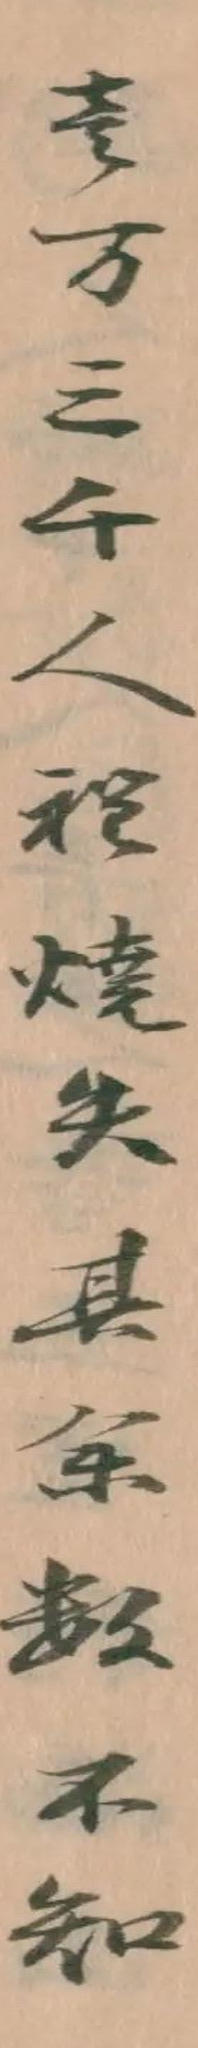壱万三千人程焼失其余数不知
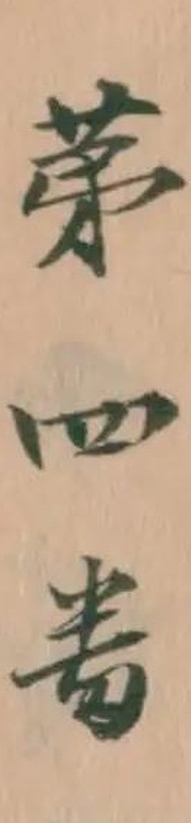第四番
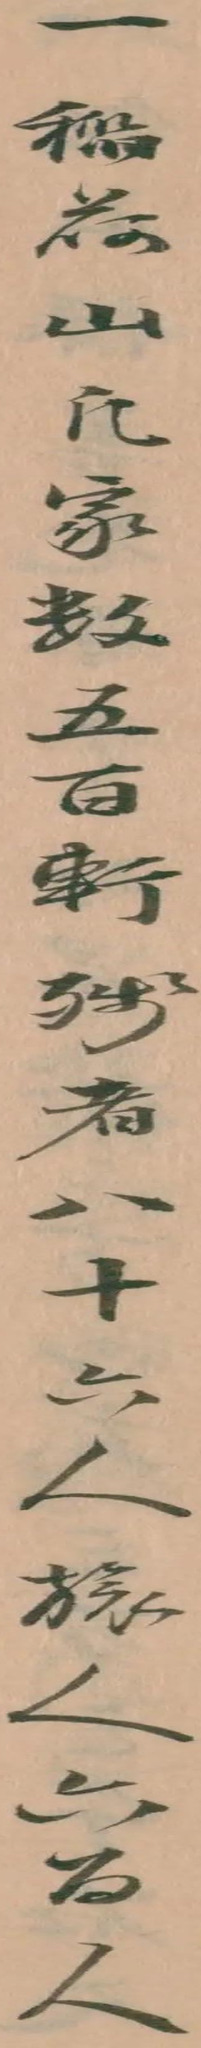一稲荷山凡家数五百軒残者八十六人旅人六百人
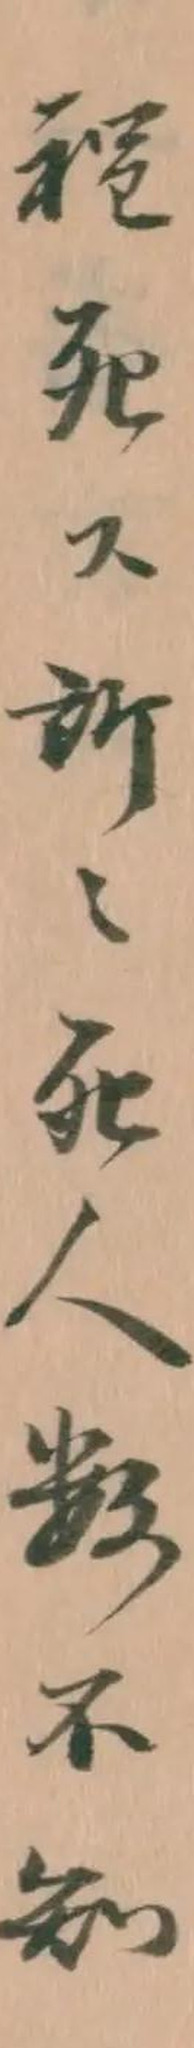程死す所々死人数不知
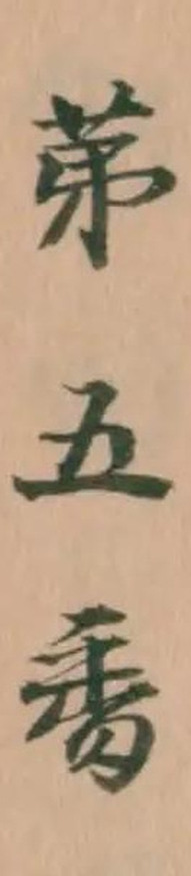第五番
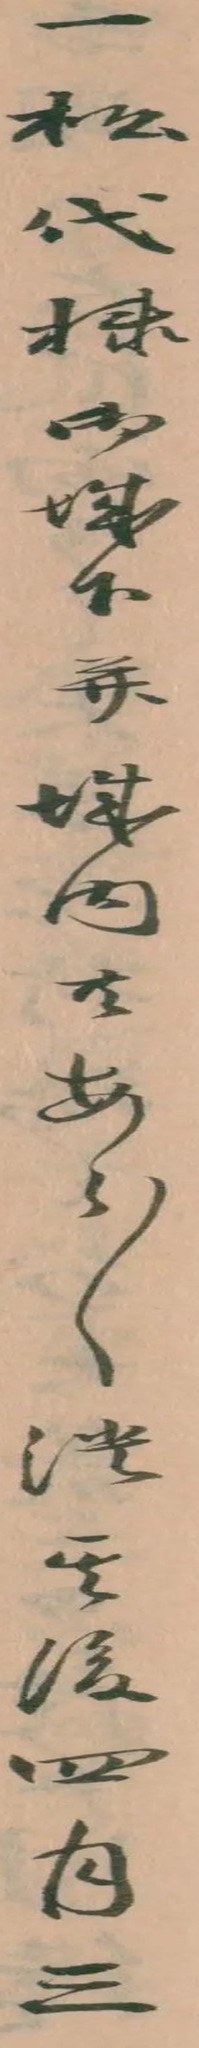一松代様御城下并御城内共あら〳〵潰其後四月三
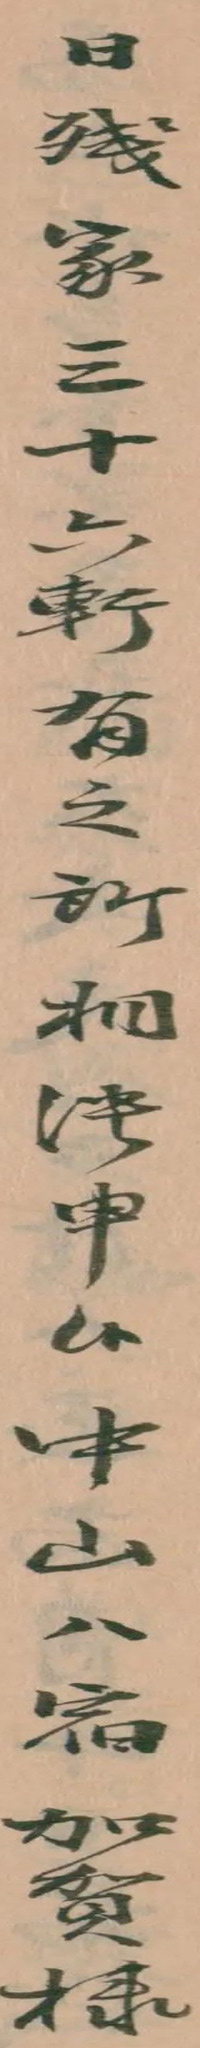日残家三十六軒有之所相潰申候中山八宿加賀様
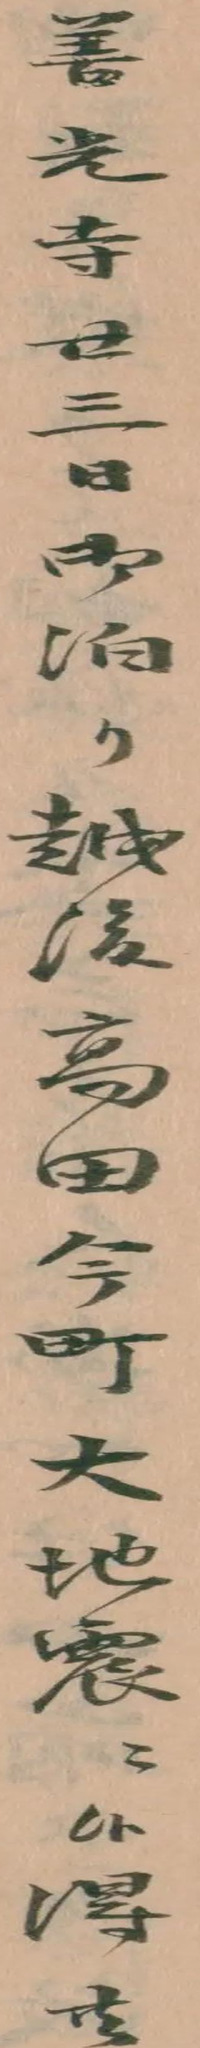善光寺廿三日御泊り越後高田今町大地震二候得共
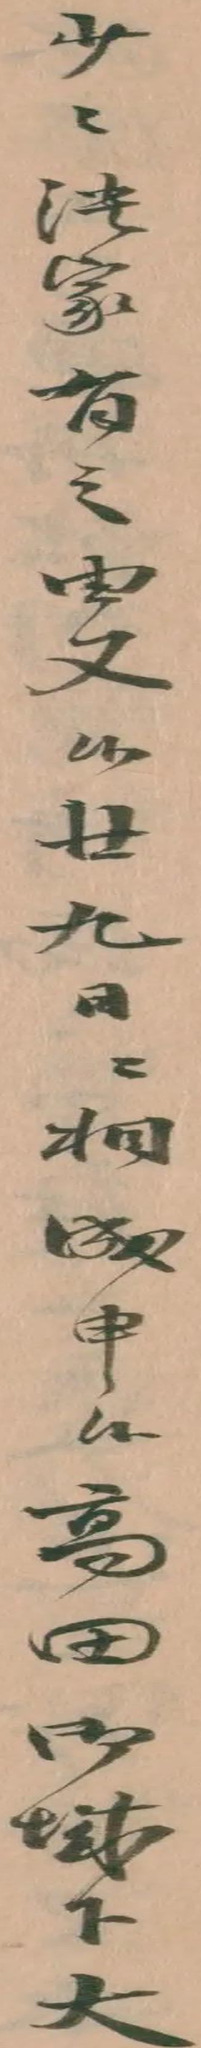少々潰家有之由又候廿九日二相成申候高田御城下大
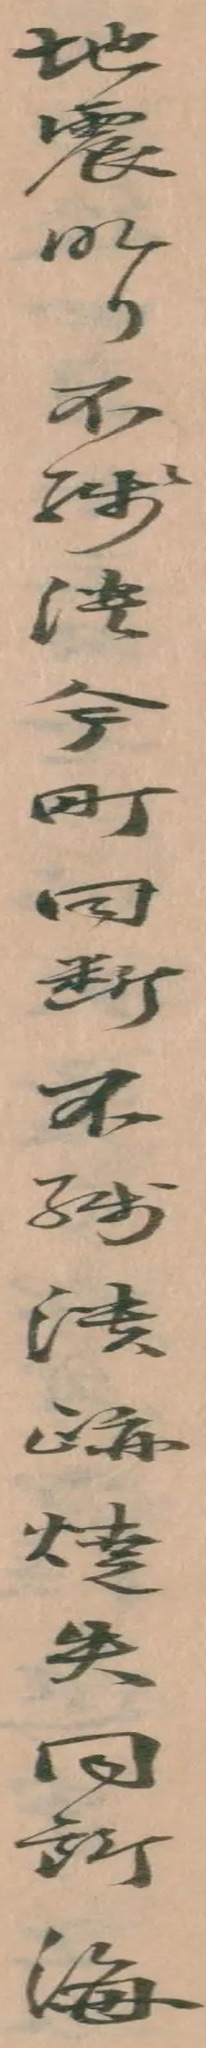地震なり不残潰今町同所不残潰跡焼失同所海
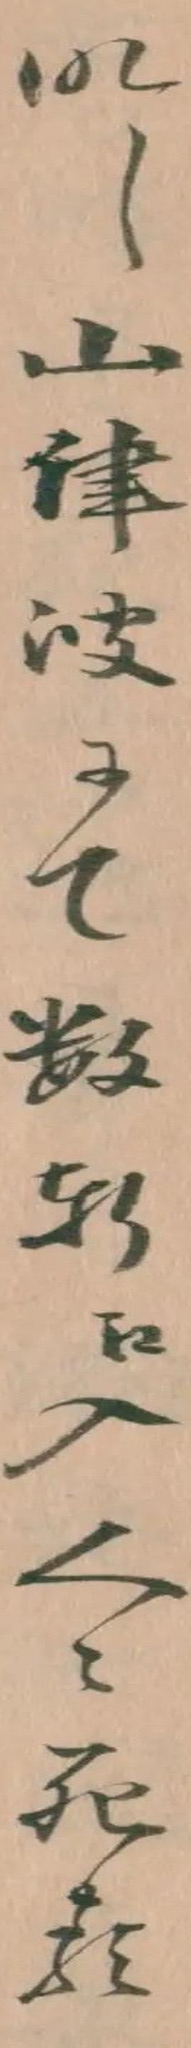なし山津波にて数軒江入人々死る
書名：地災撮要. 巻3(地震之部)-巻4(噴火之部)
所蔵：国立国会図書館 National Diet Library, JAPAN
